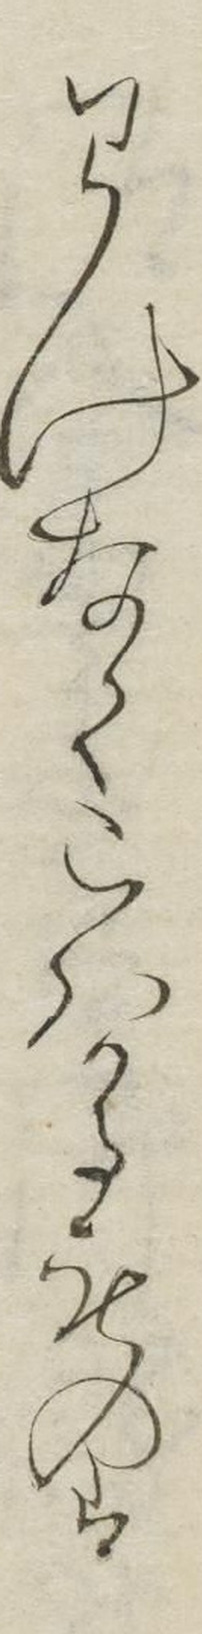わけなくこハかるものは
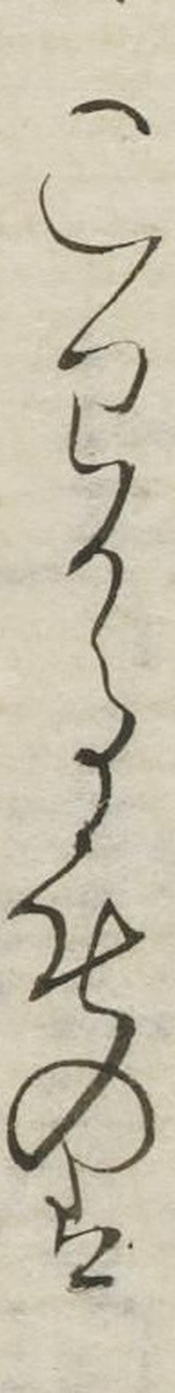こわかるものは
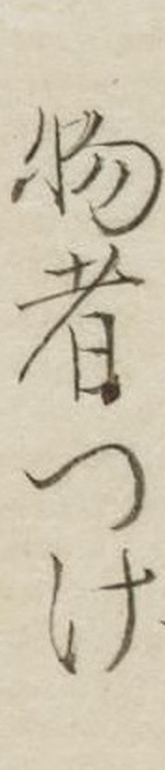物者つけ
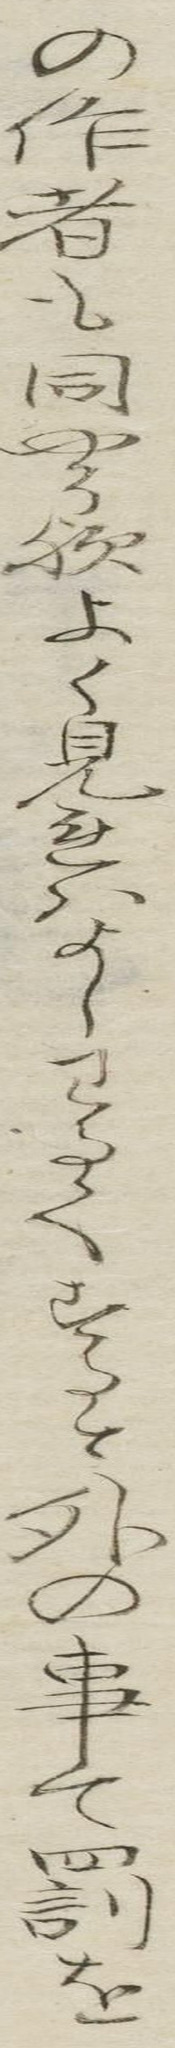の作者も同やう歟よく見れハよしわらてすると外の事て罰を
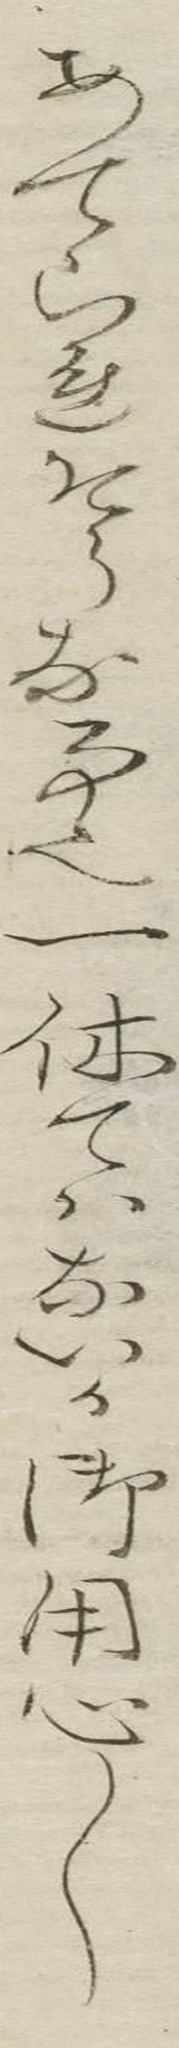あてられけりな事也一休てハないかご用心〳〵

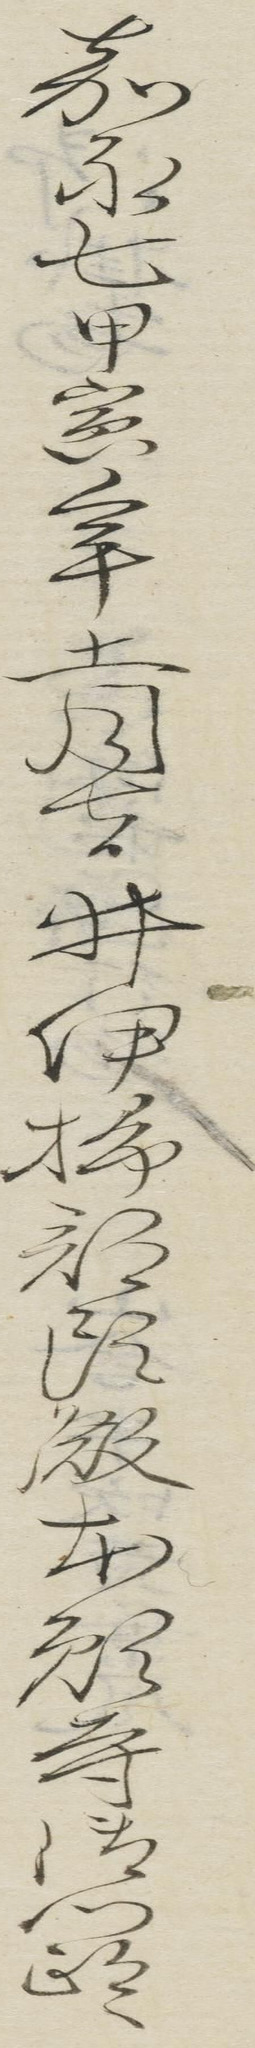嘉永七甲寅年十一月七日井伊掃部頭殿本願寺御門路へ
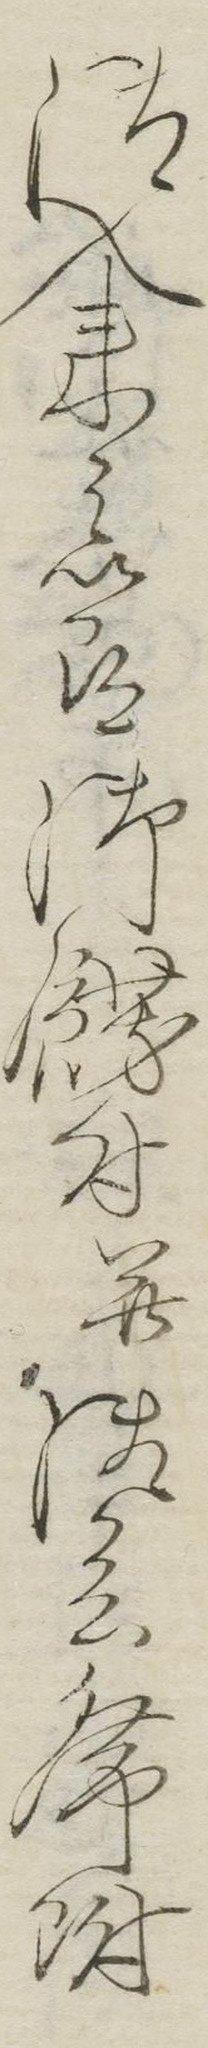御入来之節御飾付幷御会席附
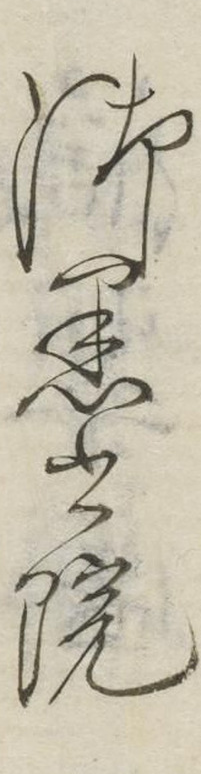御黒書院
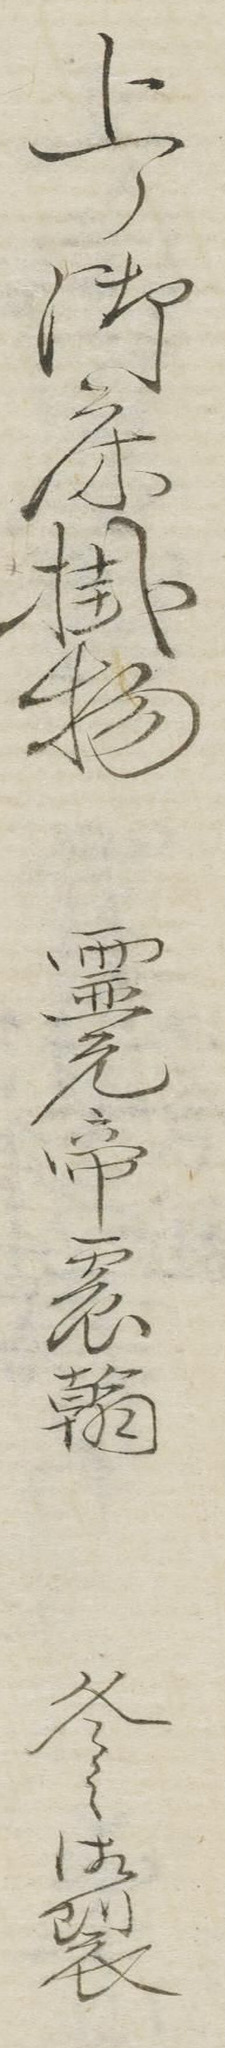上ノ御床掛物霊元帝宸翰冬の御製
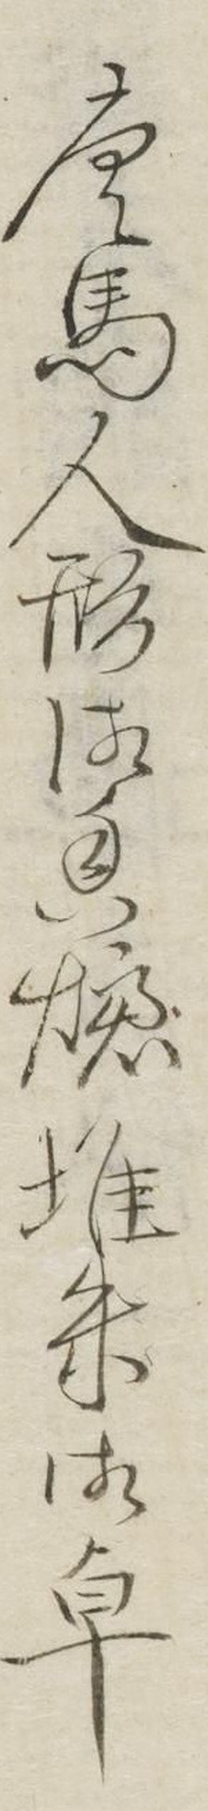唐馬人形御香爐堆朱御卓
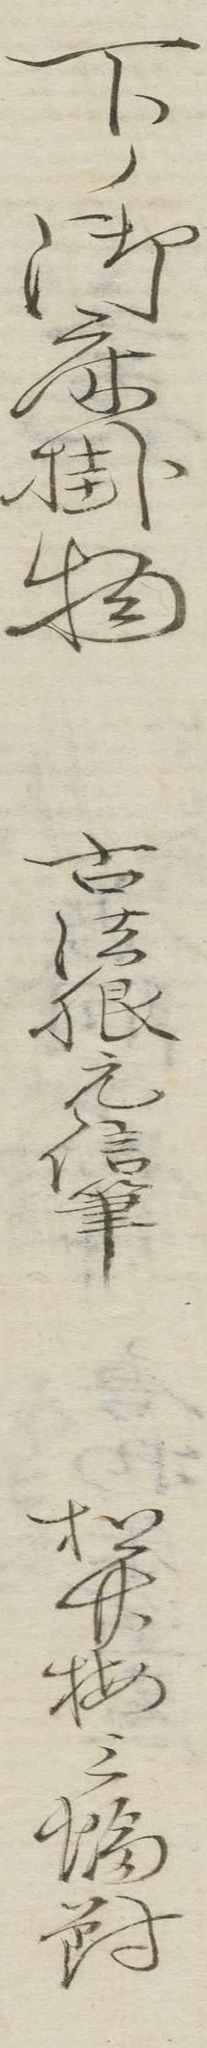下ノ御床掛物古法眼元信筆松竹梅三幅對
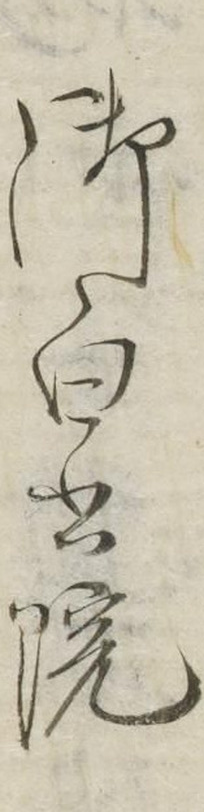御白書院
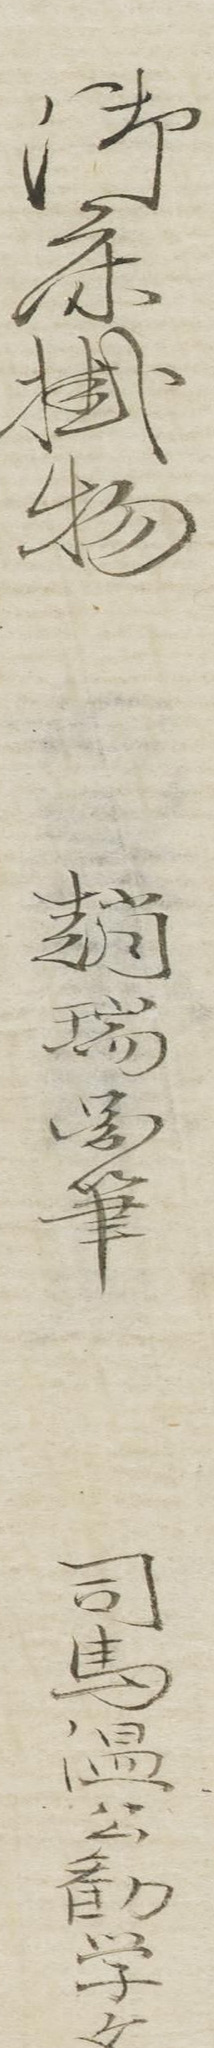御床掛物趙瑞圖筆司馬温公勧学文
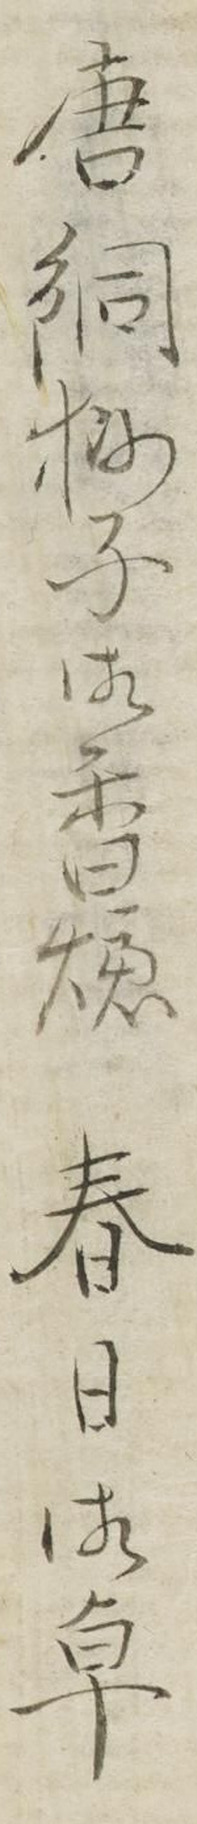唐銅獅子御香爐春日御卓

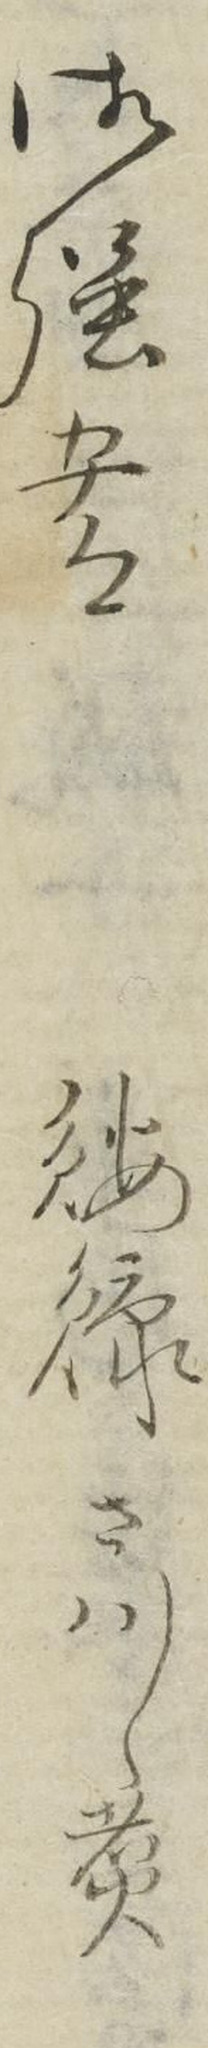御強肴鮟鱇さハ〳〵煮
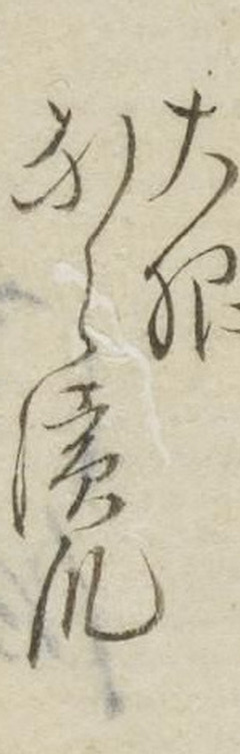なら漬瓜
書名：大地震實録
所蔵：東京大学地震研究所図書室 Earthquake Research Institute Library, The University of Tokyo, JAPAN
